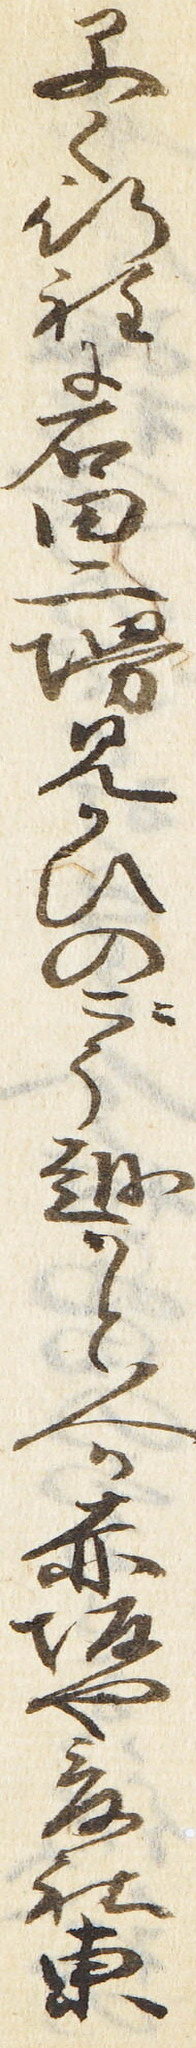早く行程に石田二堺見かひのこう越かと人か赤坂や爰社東
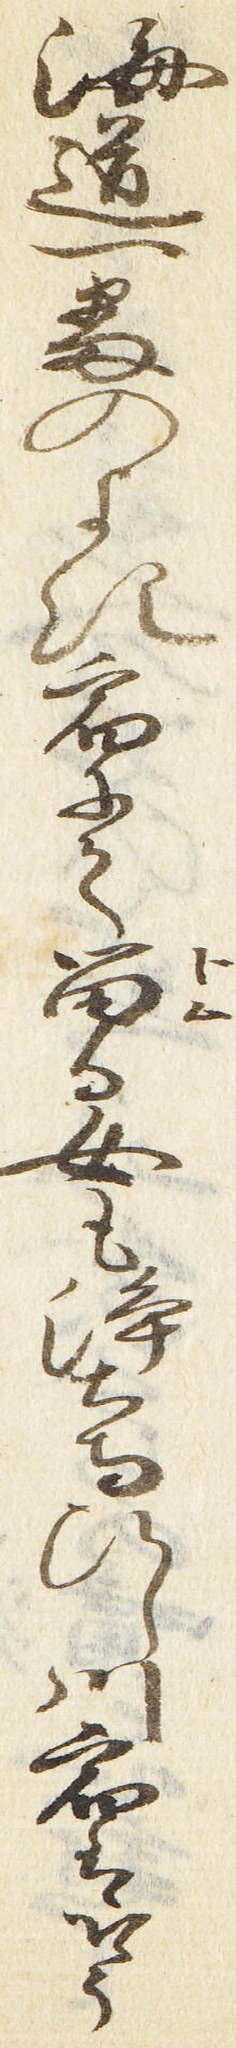海道一番のよき宿にて留る女も浄土寺ひし川宿はそう
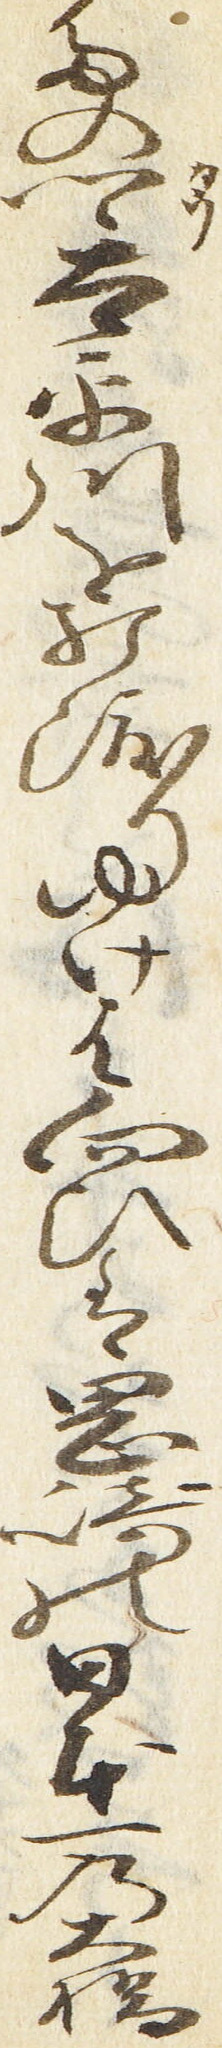たの郷太平川を打渡りゆけは向ひは岡崎の日本一の大橋
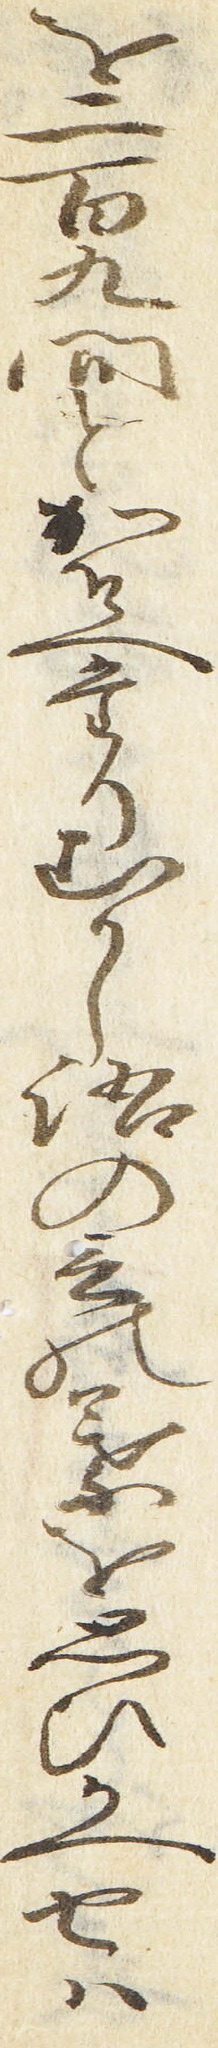を二百九間とかそへたりむかし語の言の葉を思ひかへせは

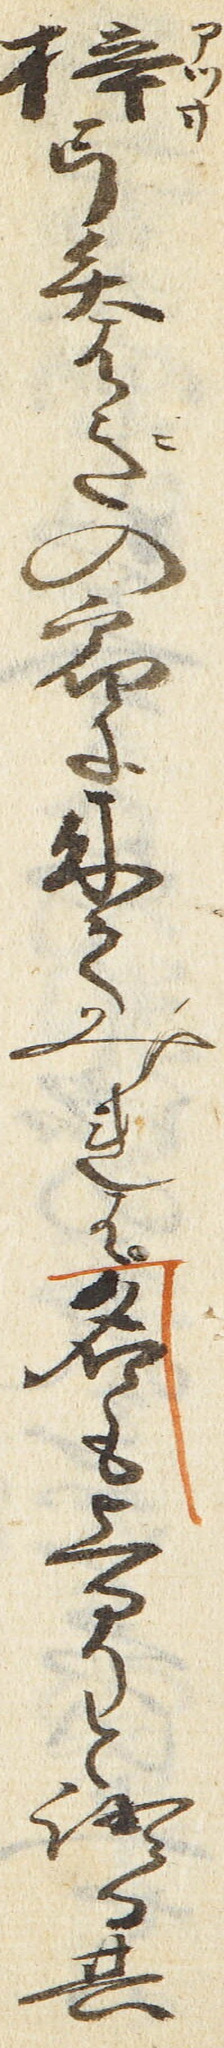梓弓矢はぎの宿に来てみれは「名も上るりと語る其
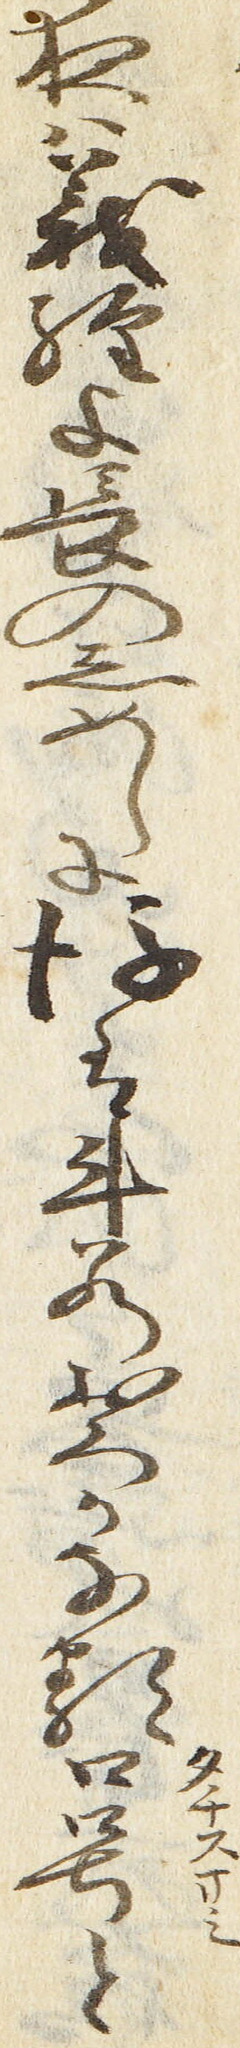夜は義経よ長のしめしに後は牛若おろかなる口号と
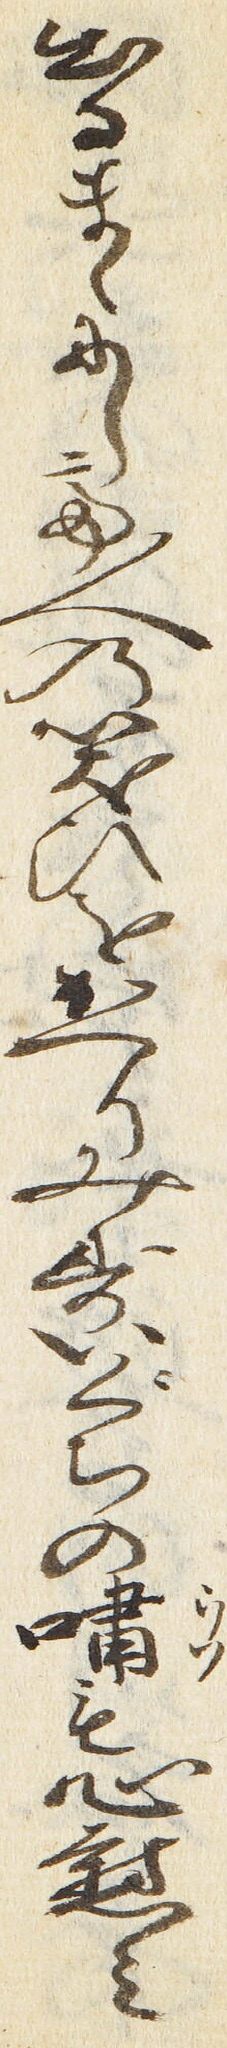出るまゝにして人の笑ひをかへりみすいぐちの嘯も心慰み
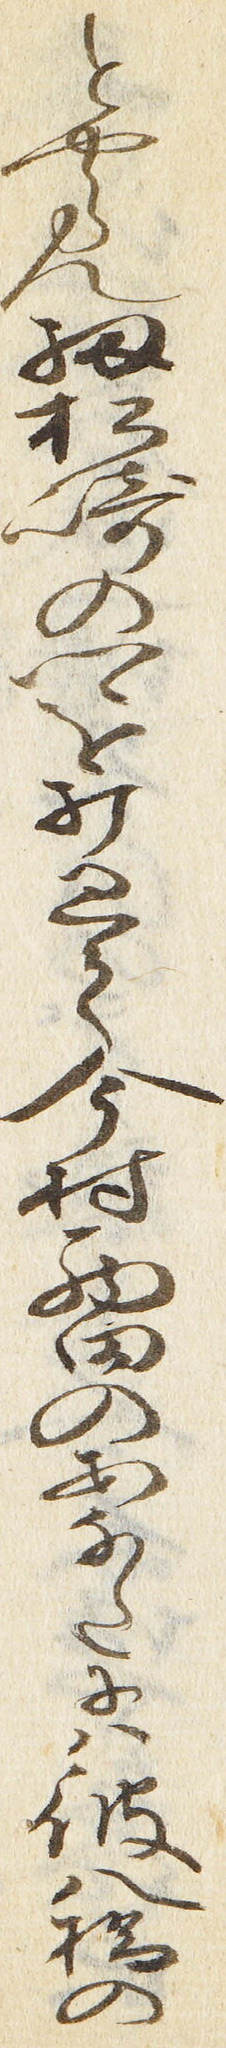とやらん扨松崎の郷を打過て今村西田のあなたには彼八橋の
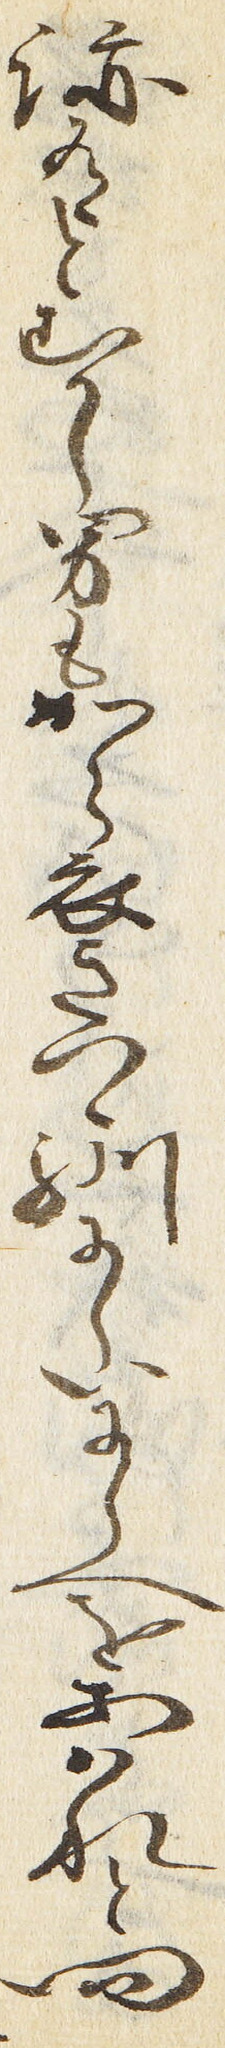跡有とむかし男もから衣きつゝ馴にしいにしへをあはれと問
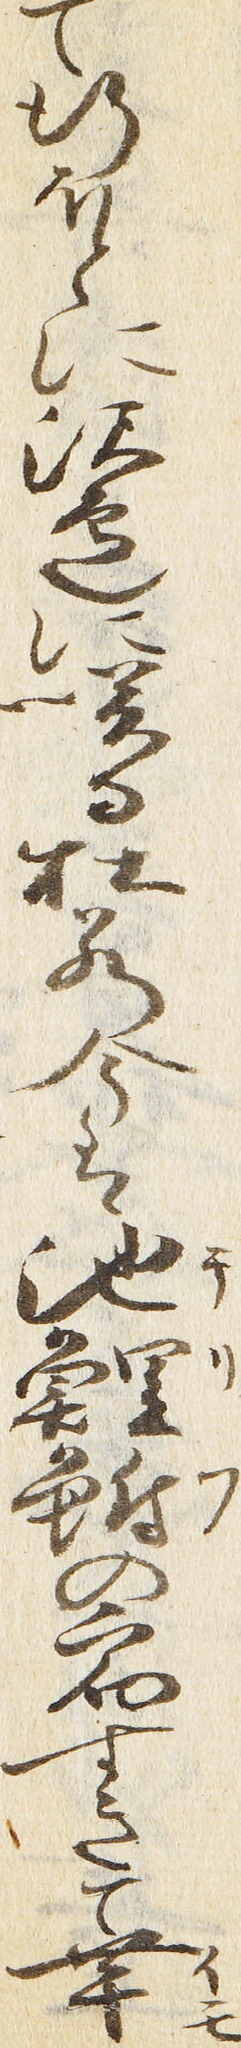て行ほとに沢辺に咲る杜若今は地鯉鮒の宿すきて芋
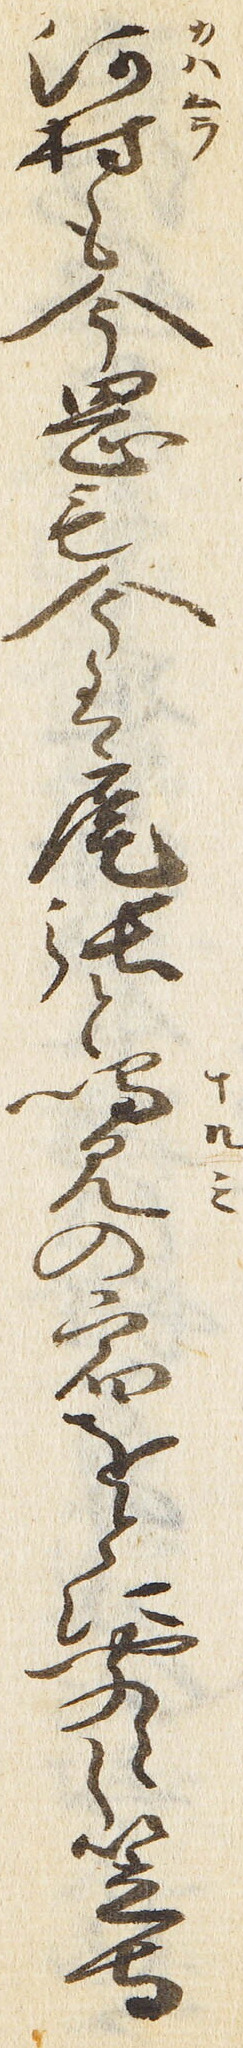河村も今岡も今は尾張と鳴見の宿をとに聞えし笠寺
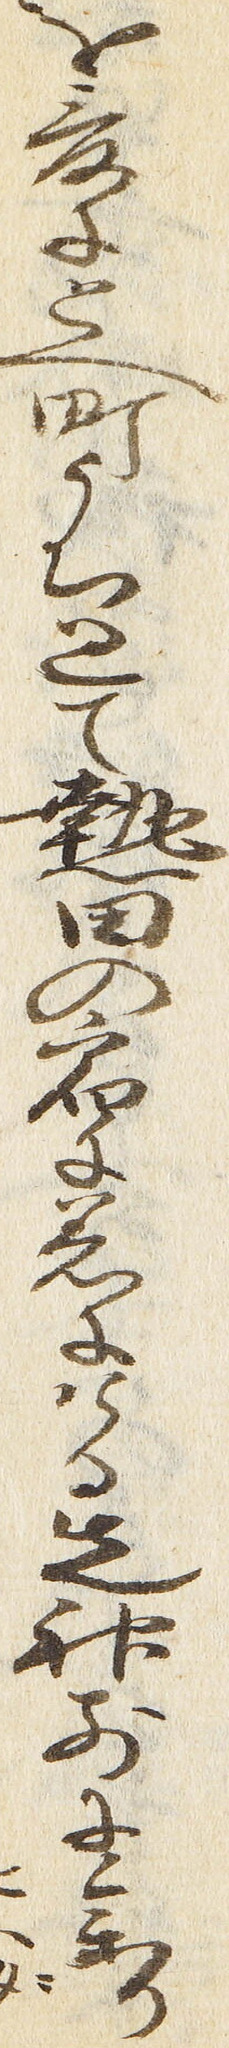を爰にとへ町うち過て熱田の宿に着にける先神前に参り
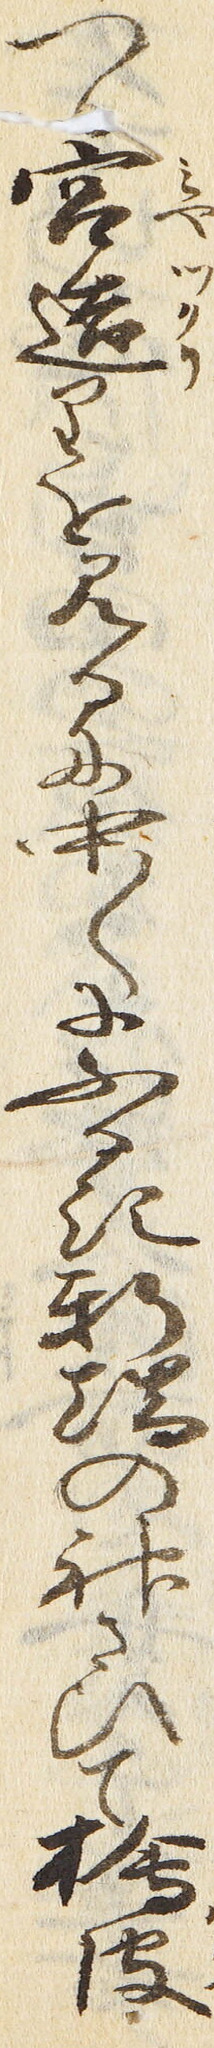つゝ宮造りを見るに中〳〵にふるき軒端の神さひて檜皮
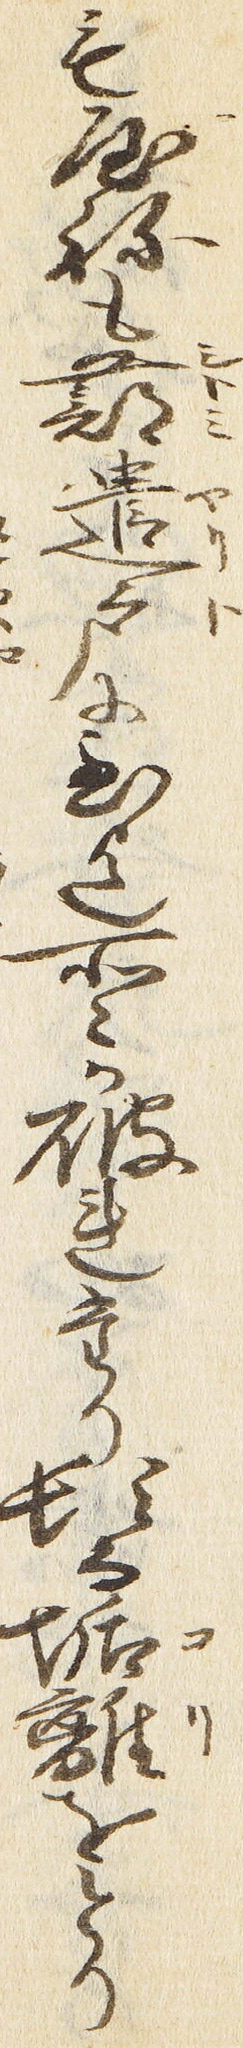もやねも蔀遣戸に至迄と所々か破れたり頓而垢離をとり
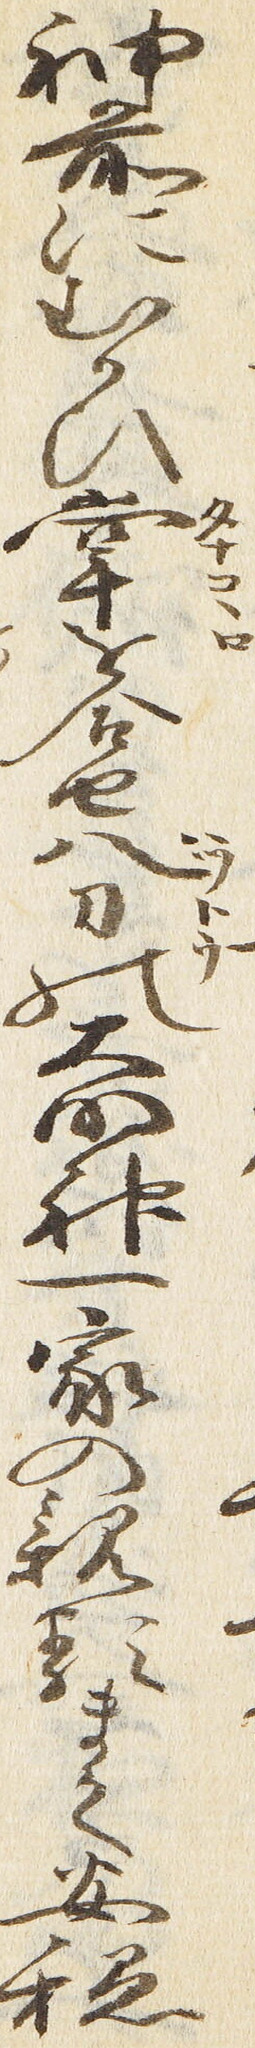神前にむかひ掌を合せ八刀の大明神一家の親類まて安穏
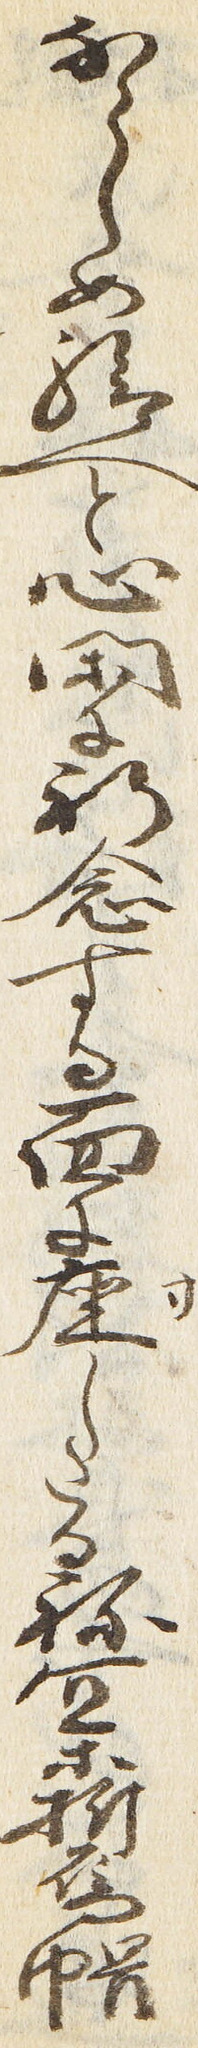ならしめ給へと心閑に祈念する面に座したる祢宜等折烏帽
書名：海陸世話日記
